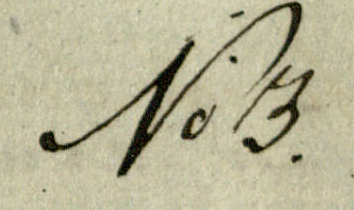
Nº 3.
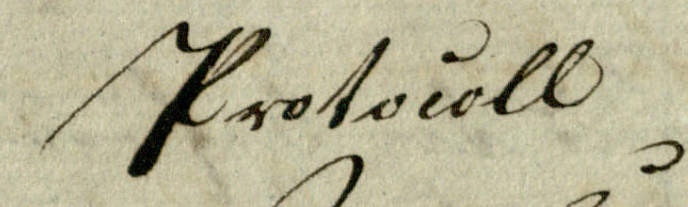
Protocoll
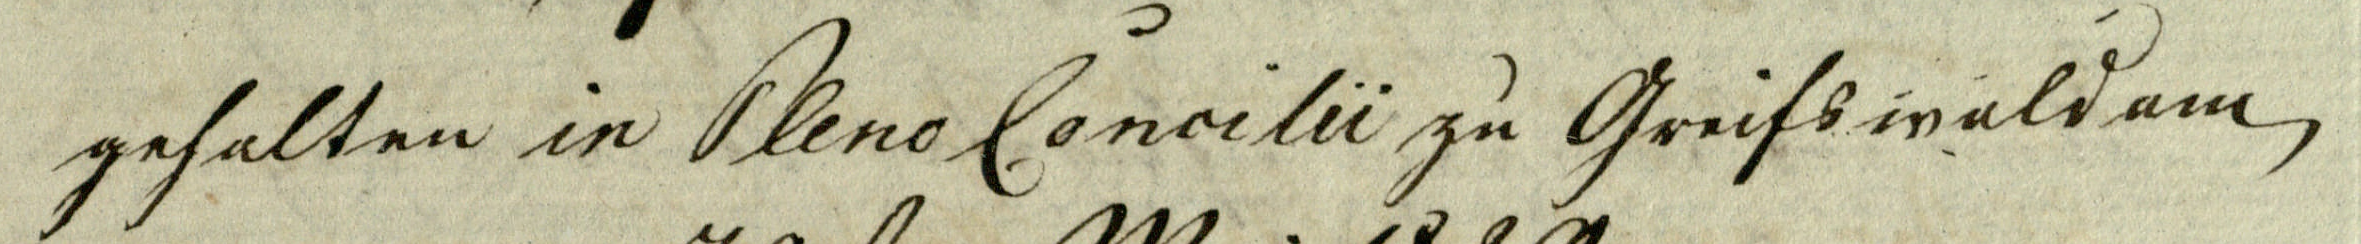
gehalten in Pleno Concilii zu Greifswald am
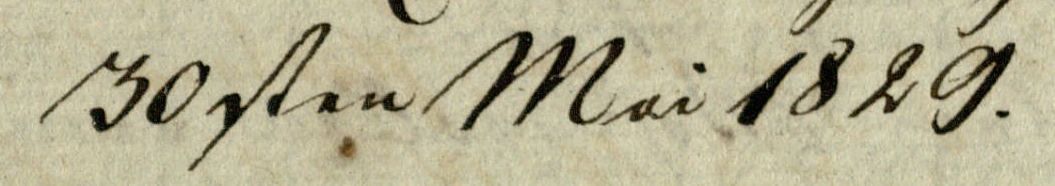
30sten Mai 1829.
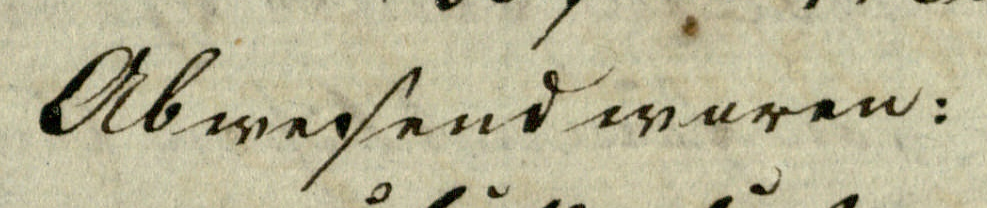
Abwesend waren:
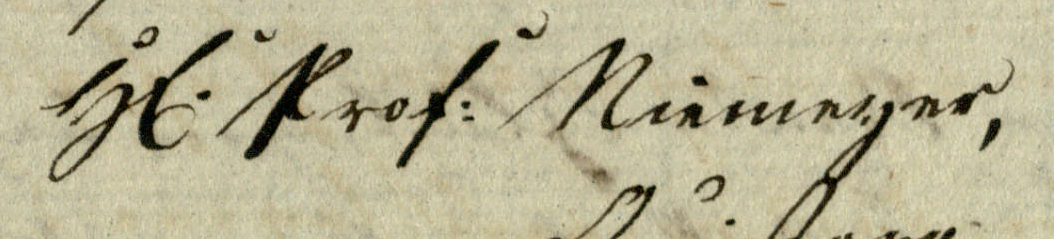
HE Prof: Niemeyer,
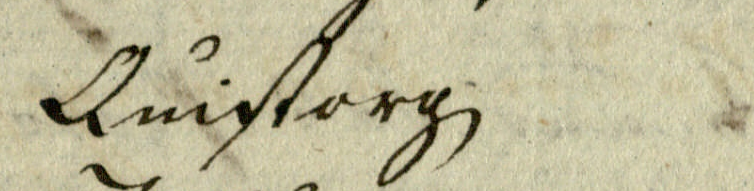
Quistorp,
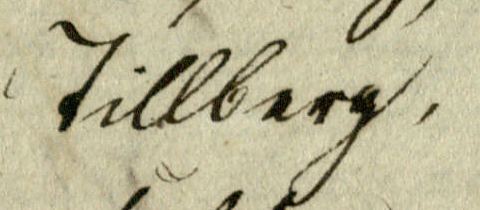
Tillberg,
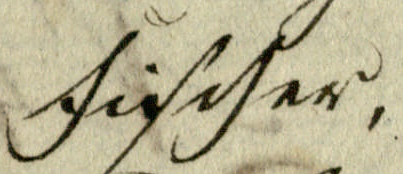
Fischer,
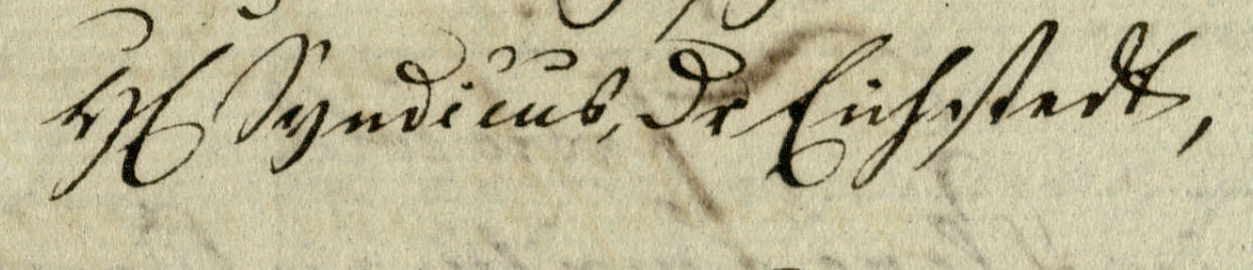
HE Syndicus, Dr Eichstedt,
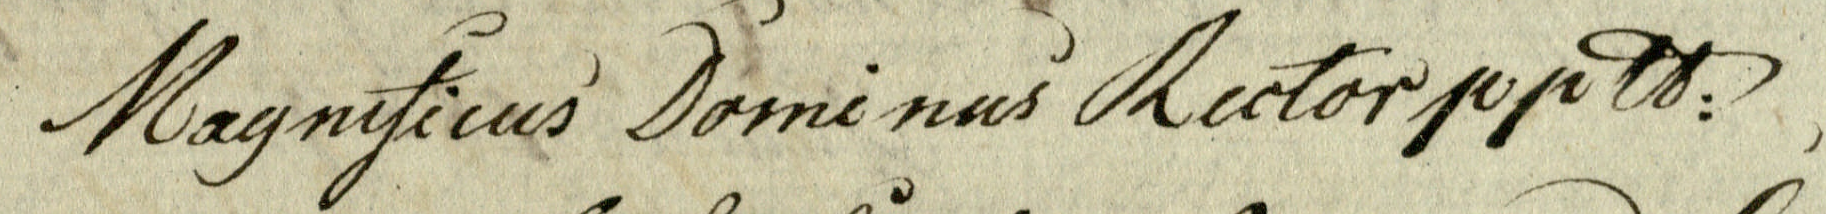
Magnificus Dominus Rector pp tt:
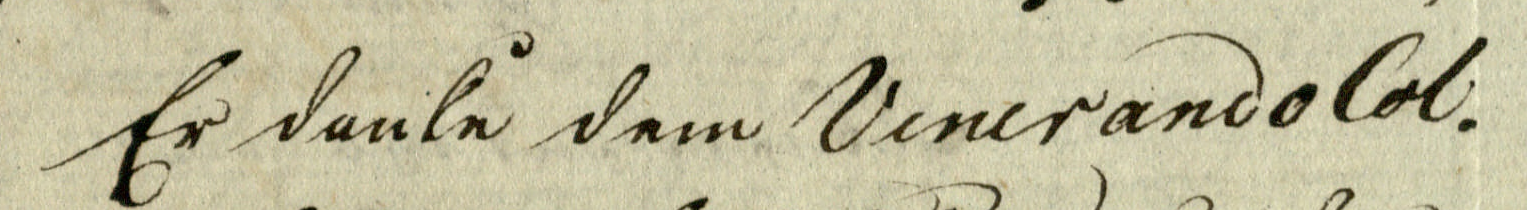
Er danke dem Venerando Col¬
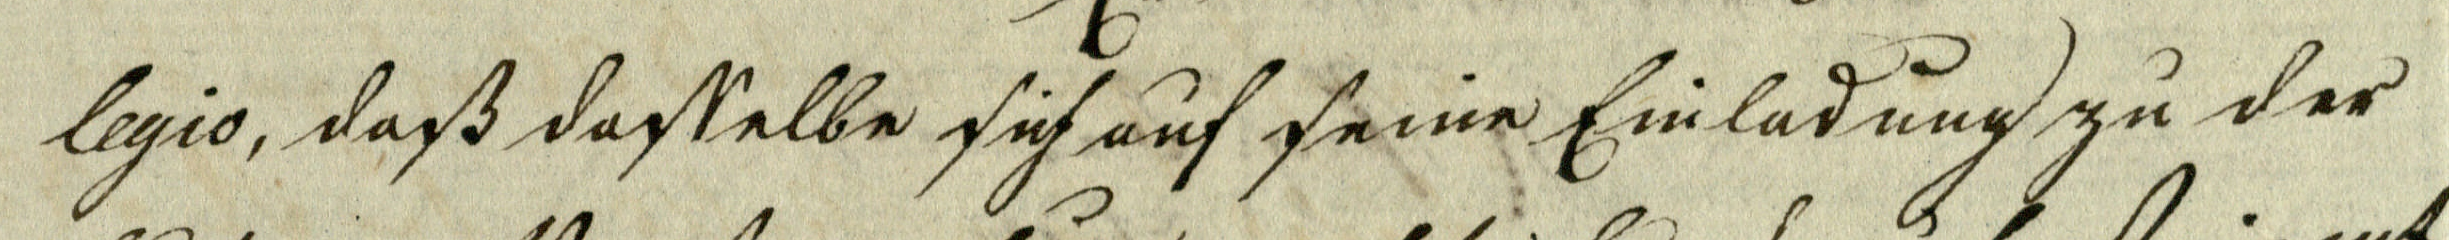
legio, daß dasselbe sich auf seine Einladung zu der
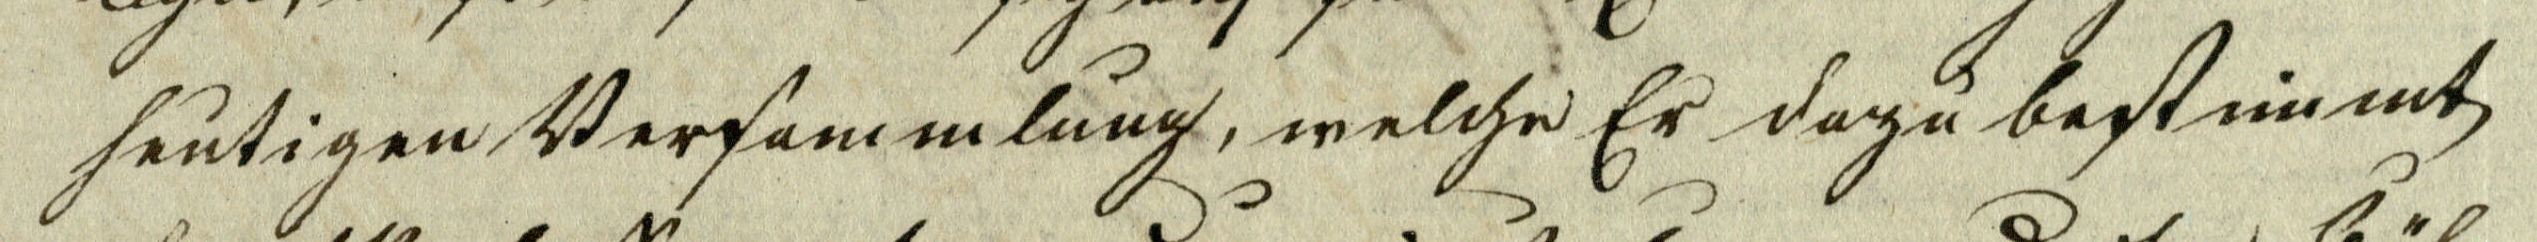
heutigen Versammlung, welche Er dazu bestimmt,
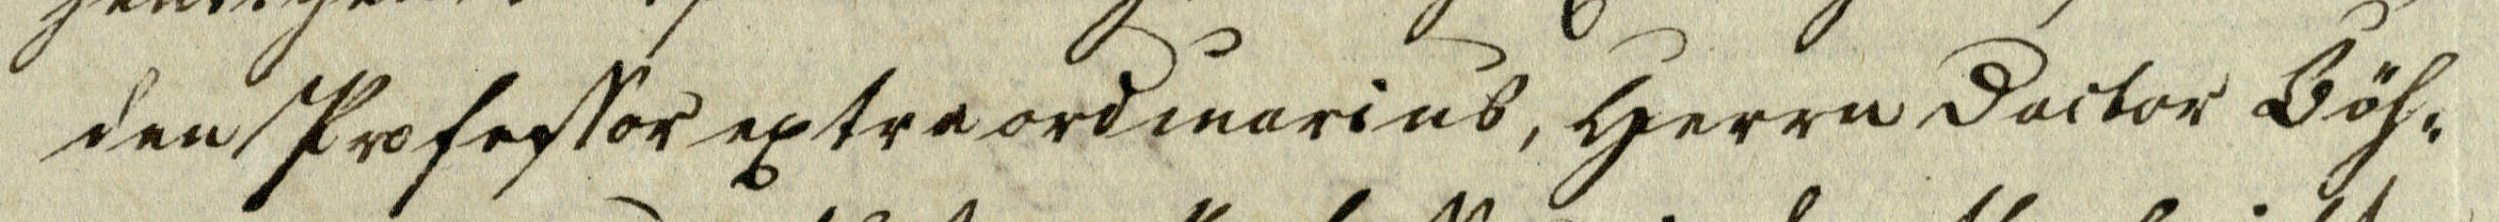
den Professor extraordinarius, Herrn Doctor Böh¬
